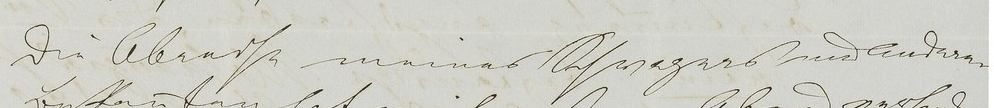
Die Abreise meines Schwagers und anderen
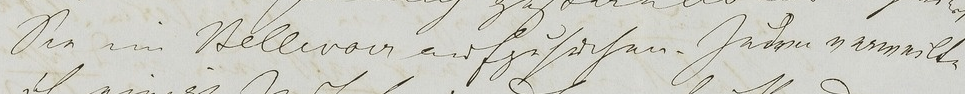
Sie im Bellevoir aufzusuchen. Zudem verweilte
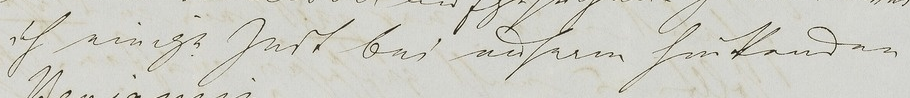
ich einige Zeit bei unserm hinkenden
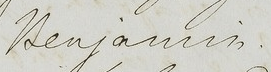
Benjamin . –
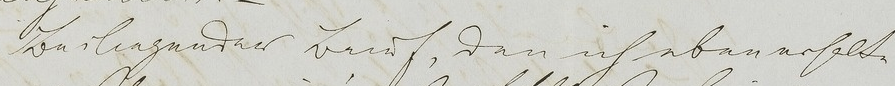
Beiliegender Brief, den ich eben erhalte
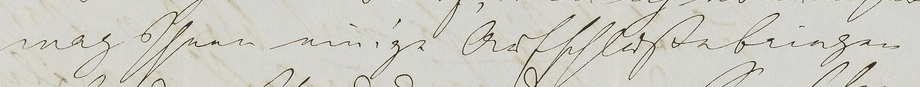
mag Ihnen einige Aufschlüße bringen
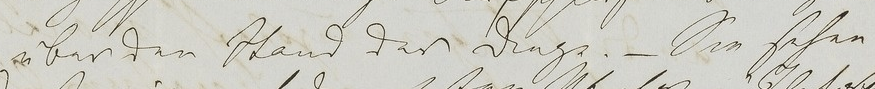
über den Stand der Dinge. – Sie sehen
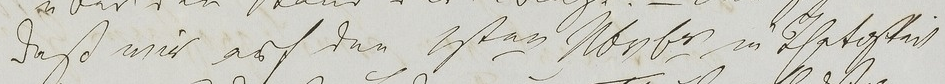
daß wir auf den 1sten Novbr in Thätigkeit
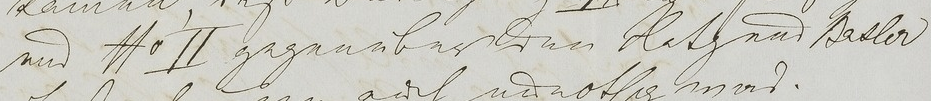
und No II gegenüber den Netz und Basler
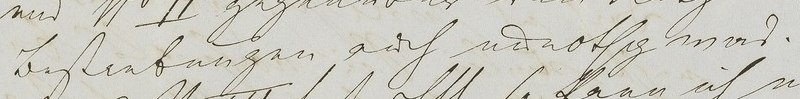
Bestrebungen auch unnöthig wird.
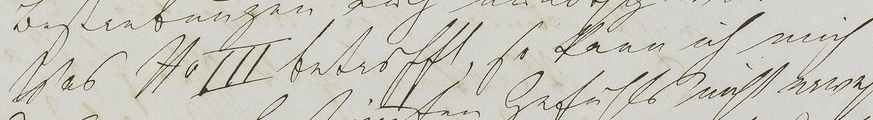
Was No III betrifft, so kann ich mich
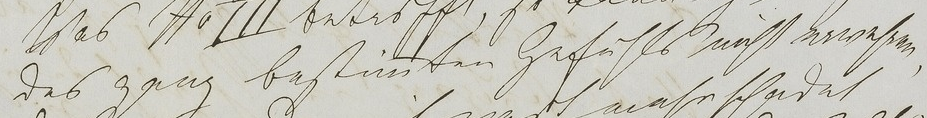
des ganz bestimmten Gefühls nicht erwehren,
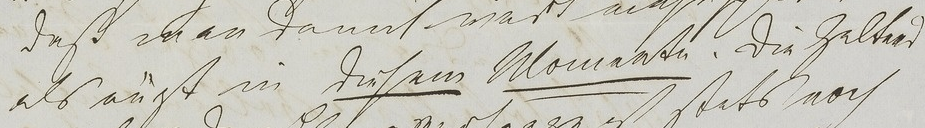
als nüzt in diesemMomente. Die Geltend-
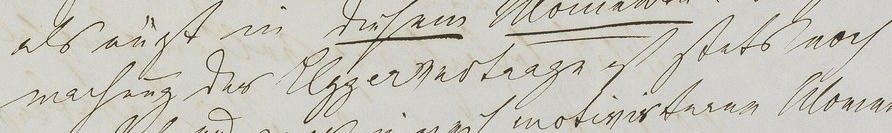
machung der Elggerverträge ist stets noch
